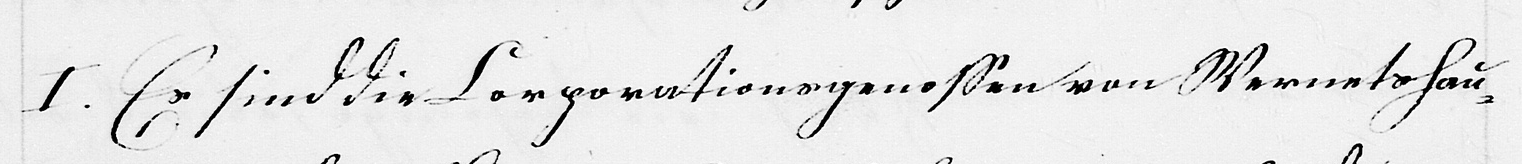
I. Es sind die Corporationsgenoßen von Wernetshau¬
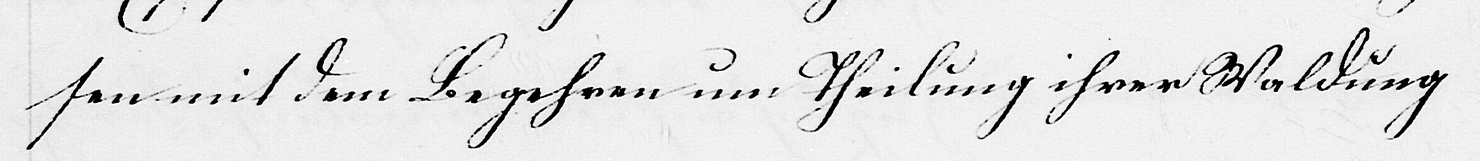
sen mit dem Begehren um Theilung ihrer Waldung
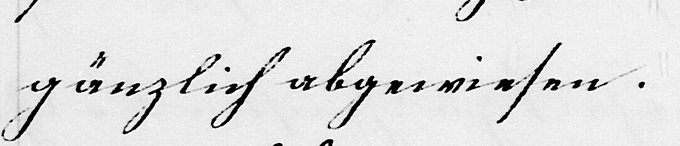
gänzlich abgewiesen.
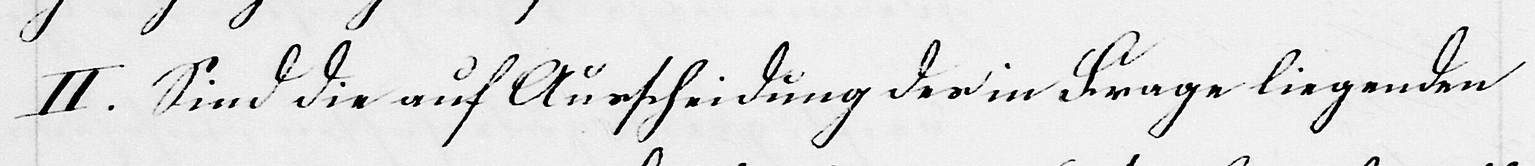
II. Sind die auf Ausscheidung des in Frage liegenden
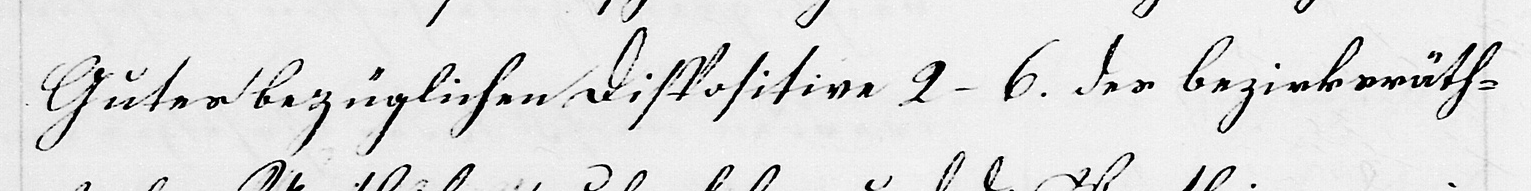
Gutes bezüglichen Dispositive 2−6. des bezirksräth¬
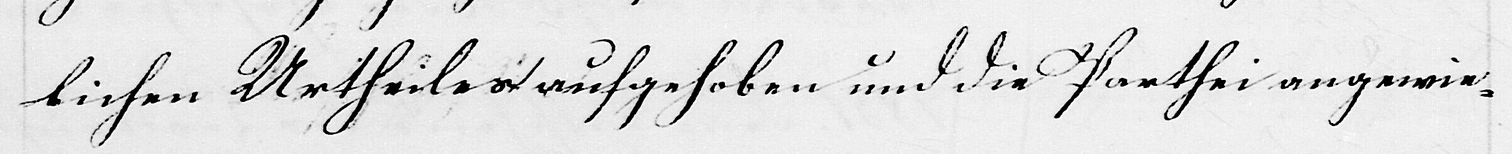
lichen Urtheiles aufgehoben und die Parthei angewie¬
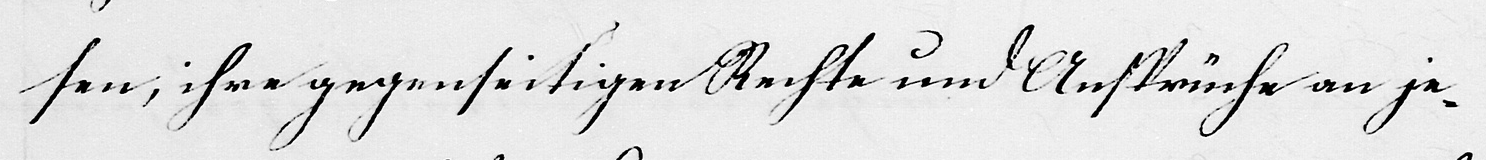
sen, ihre gegenseitigen Rechte und Ansprüche an je¬
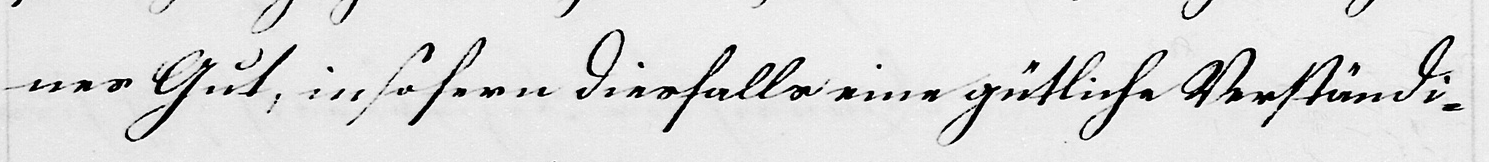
nes Gut, insofern diesfalls eine gütliche Verständi¬
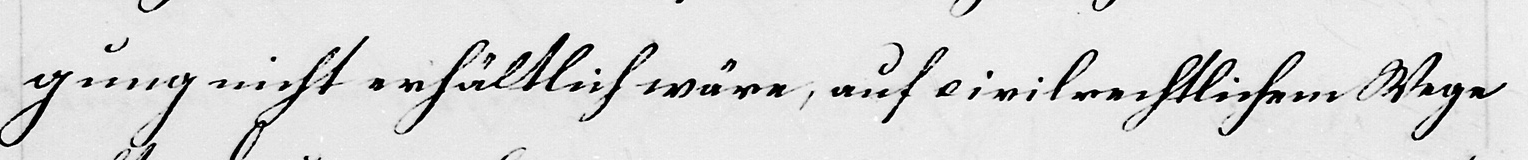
gung nicht erhältlich wäre, auf civilrechtlichem Wege
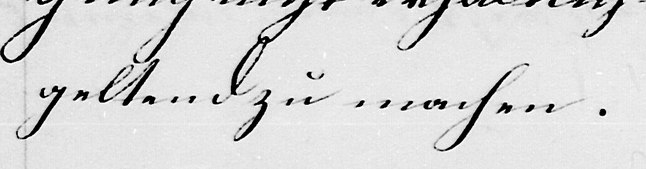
geltend zu machen.
